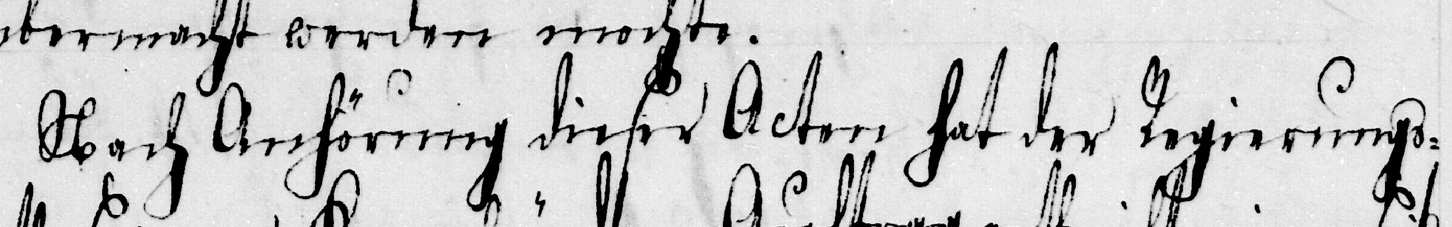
Nach Anhörung dieser Acten hat der Regierungs¬
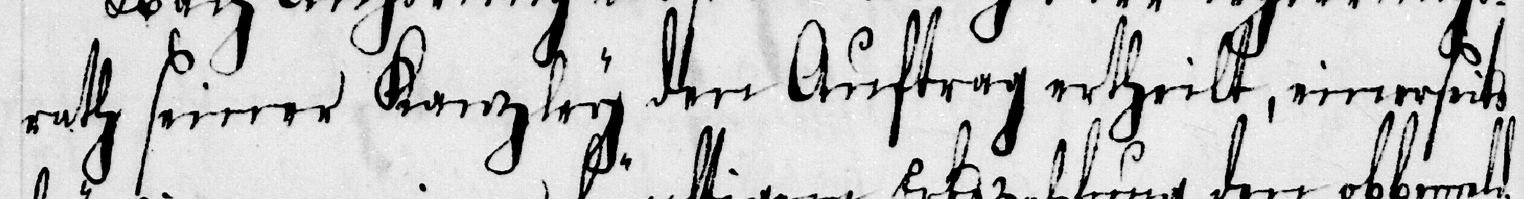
rath seiner Kanzley den Auftrag ertheilt, einerseits
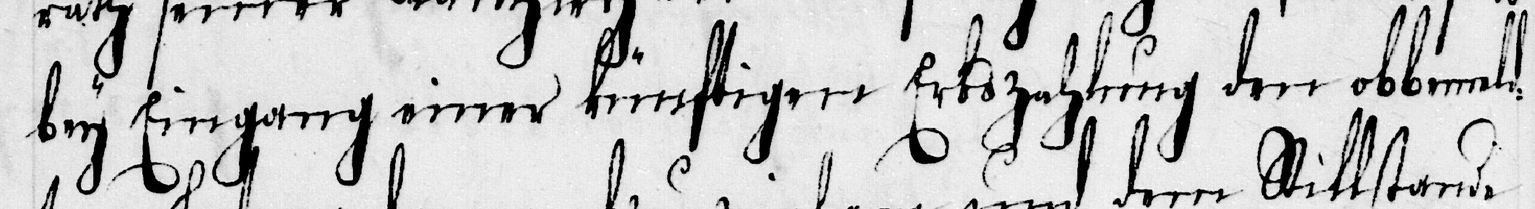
bey Eingang einer künftigen Erbszahlung den obbemel¬
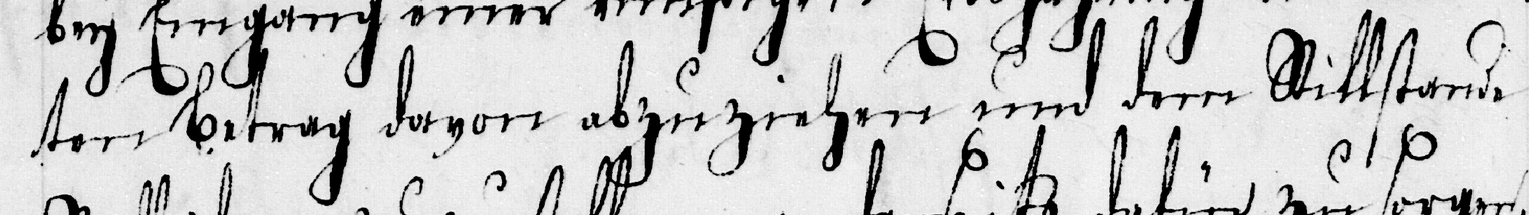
dten Beytrag davon abzuziehen und dem Stillstande
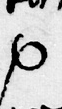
60.
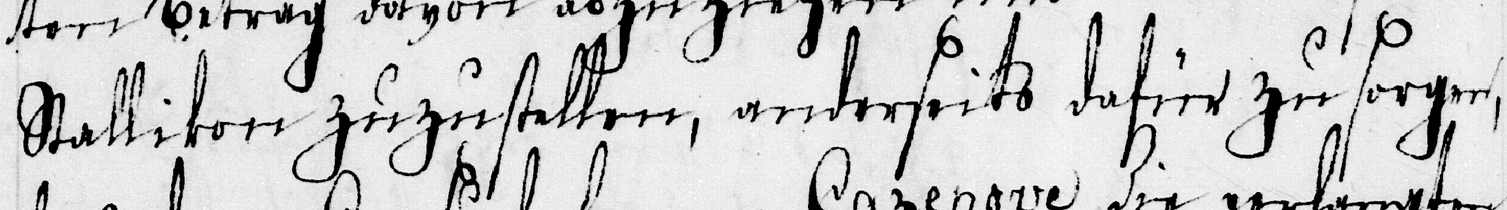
Stallikon zuzustellen, anderseits dafür zu sorgen,
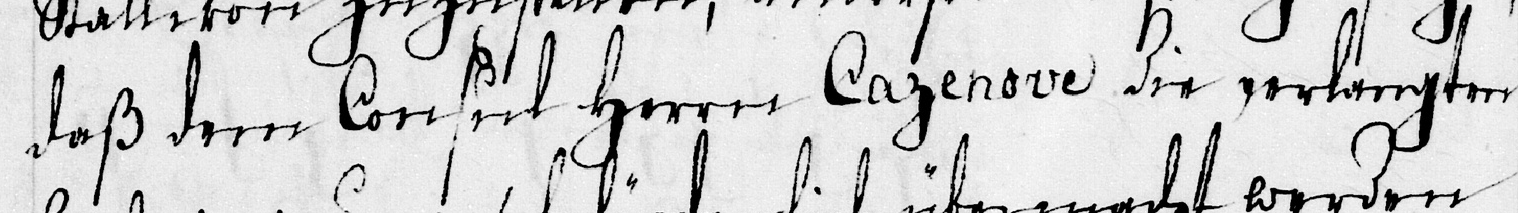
daß dem Consul Herrn Cazenove die verlangten
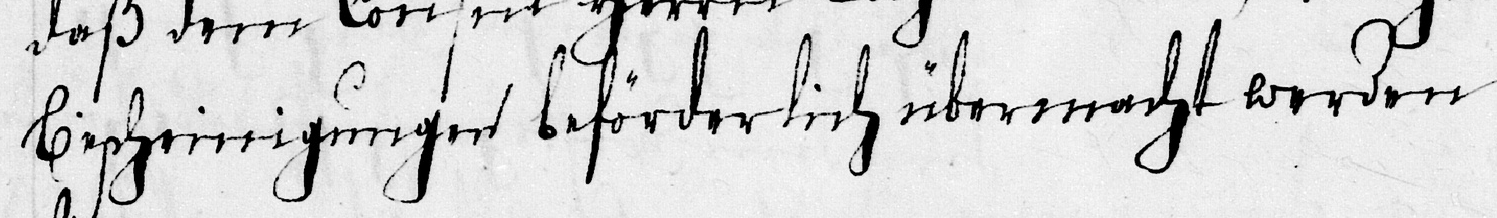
Bescheinigungen beförderlich übermacht werden
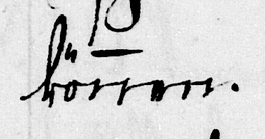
können.
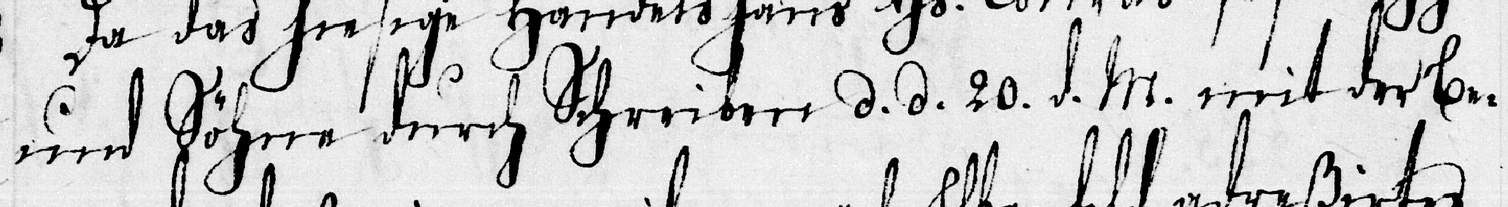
und Söhne durch Schreiben d. d. 20. d. M. mit der Bes¬
